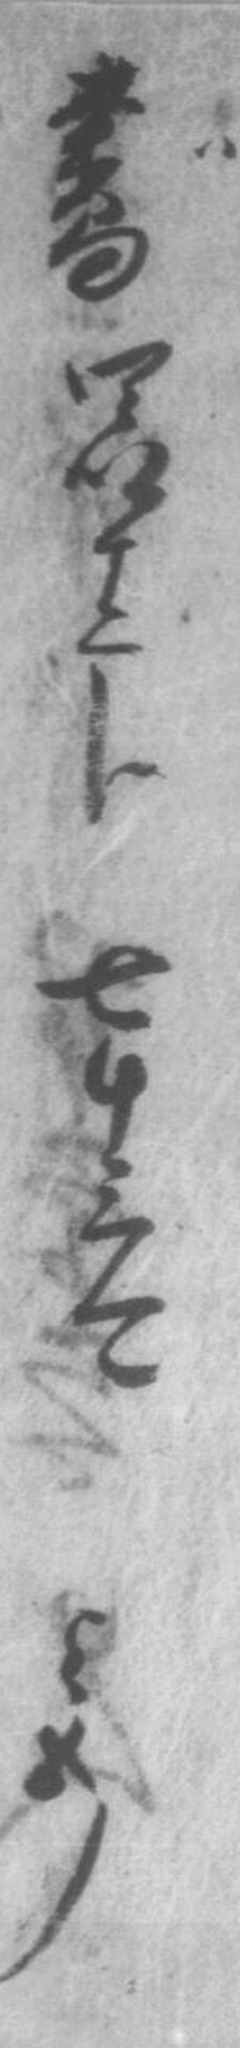桑畠四畝十二分七斗三合与五郎
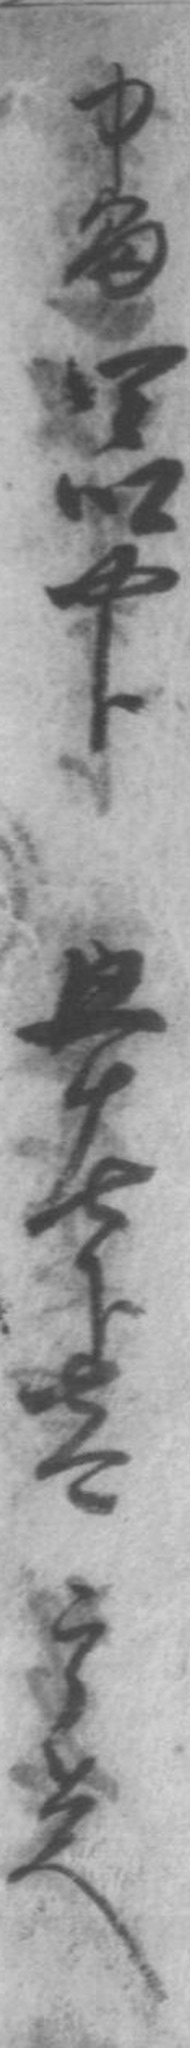中畠四畝四分五斗七升七合二郎兵衛
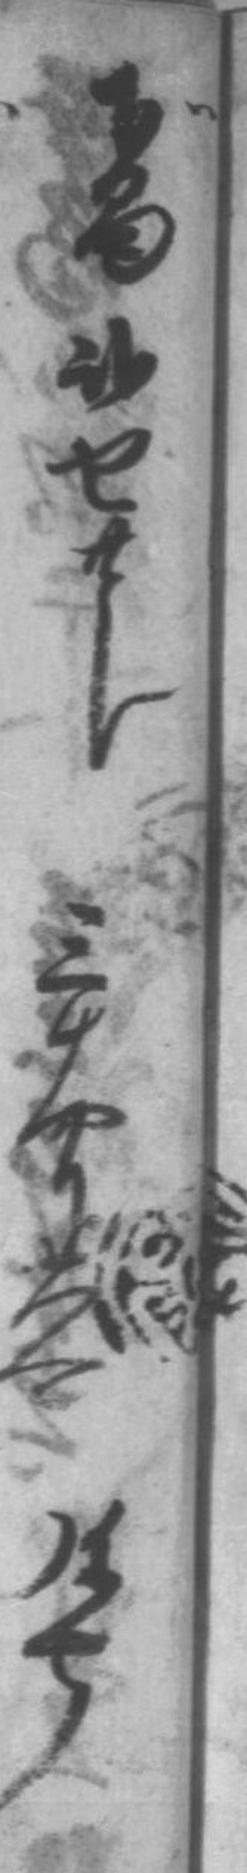下畠弐せ廿分三斗四升六合弥七郎
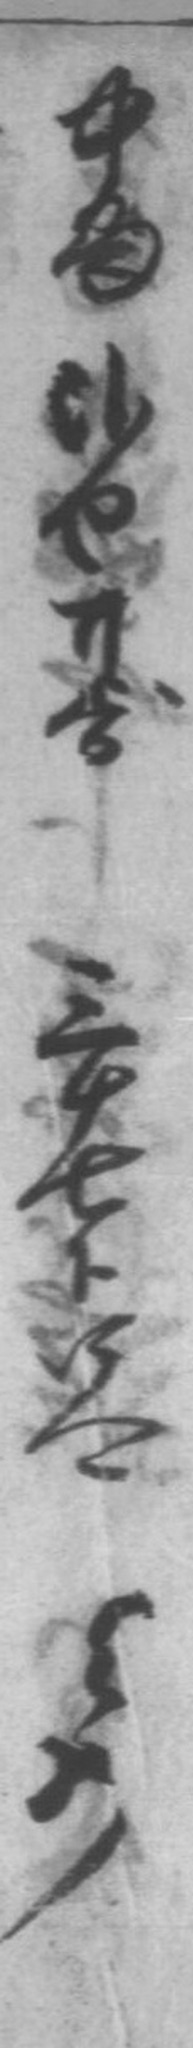中畠弐セ廿歩三斗七升四合与五郎

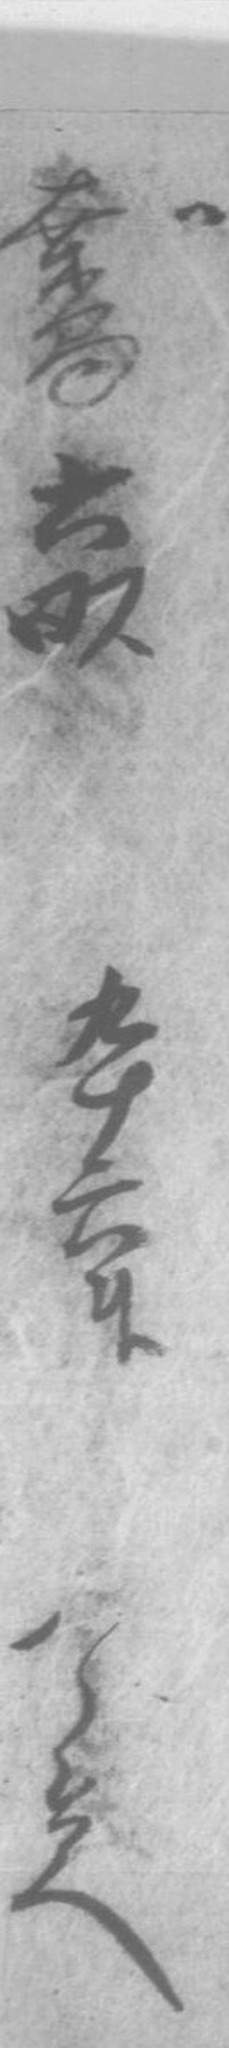桑畠六畝九斗六升八郎兵衛
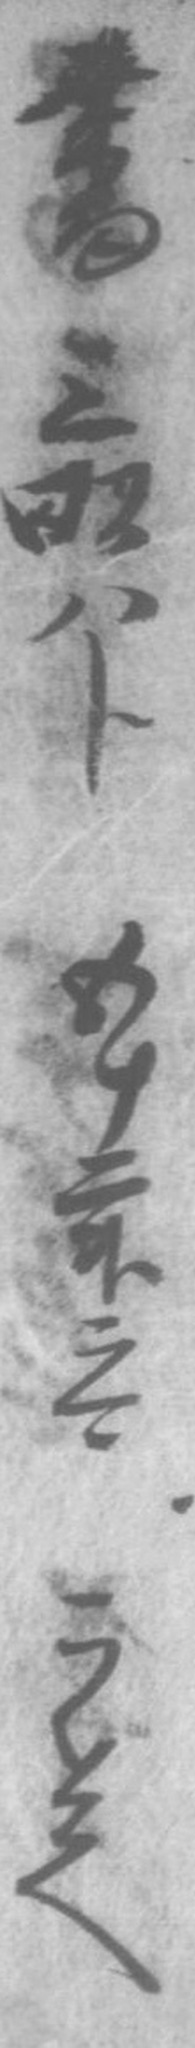桑畠三畝八分五斗二升二合二郎兵衛
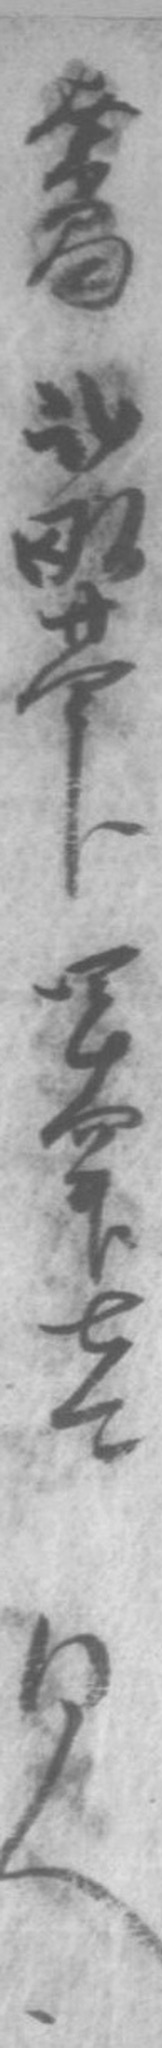桑畠弐畝廿四分四斗四升七合同人
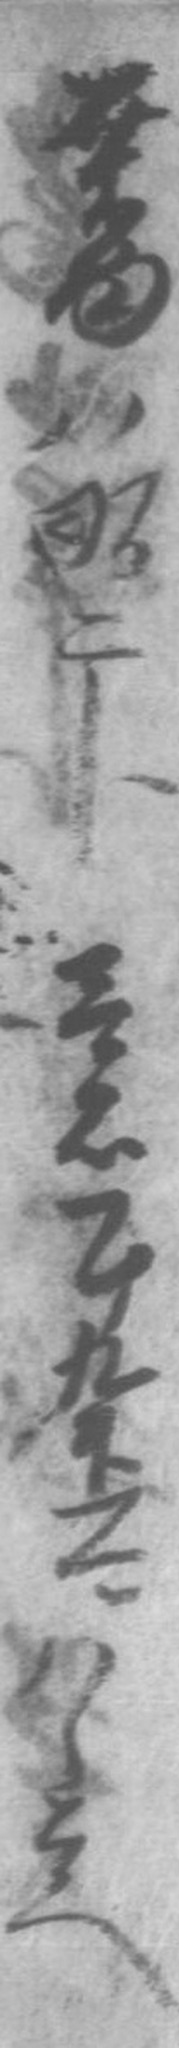桑畠八畝二分壱石一斗九升一合八郎兵衛
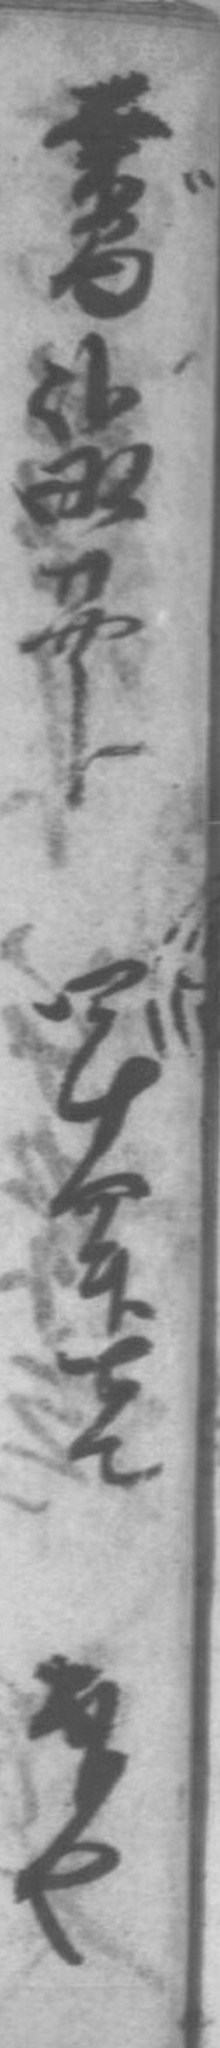桑畠弐畝廿四分四斗四升七合おりや
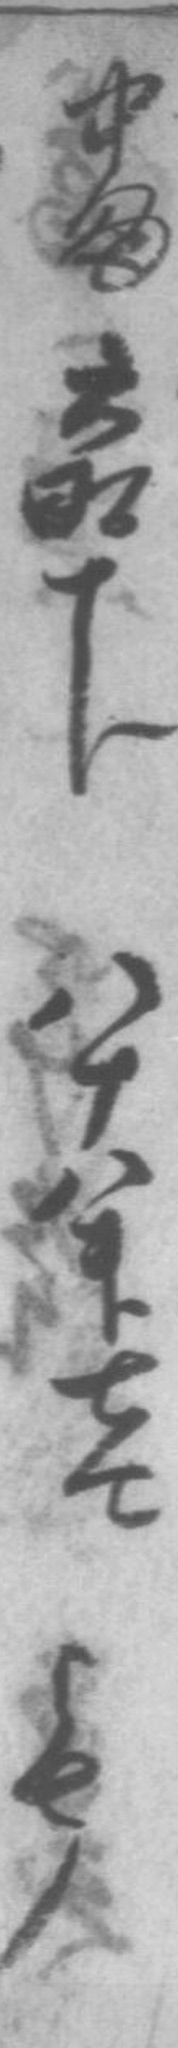中畠六畝十分八斗八升七合与七郎
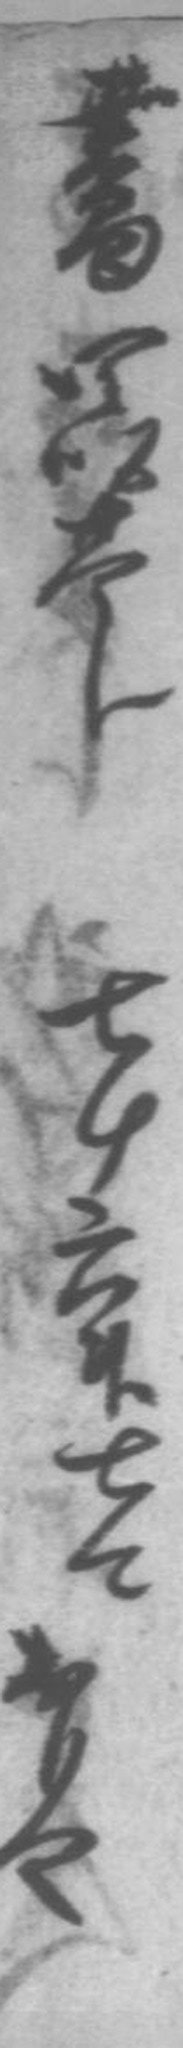桑畠四畝廿一分七斗六升七合おいや
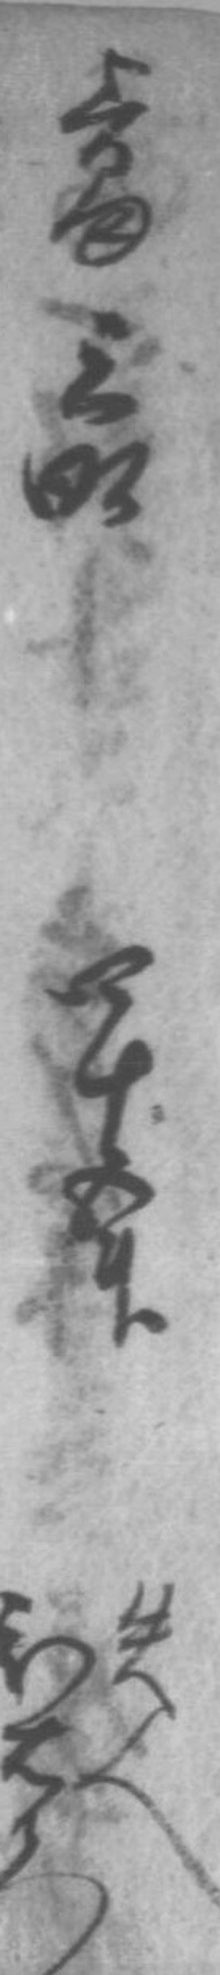上畠三畝四斗五升新右衛門
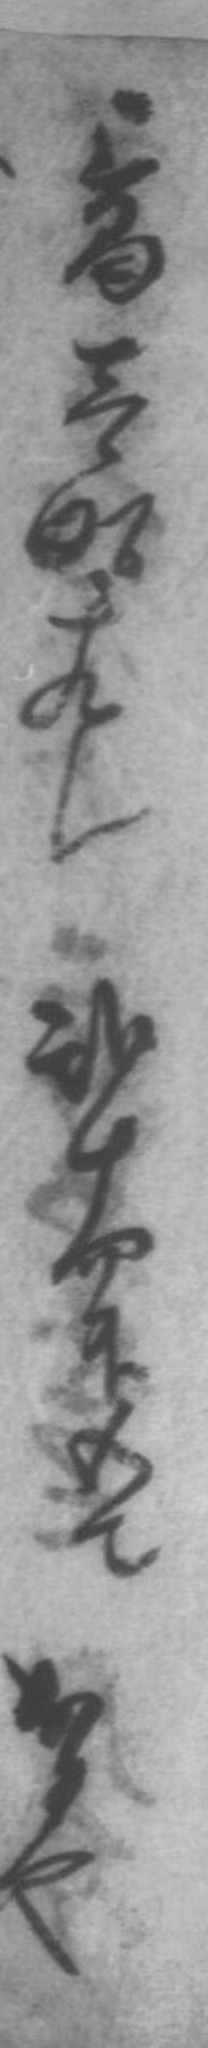上畠壱畝十九分分弐斗四升五合おりや

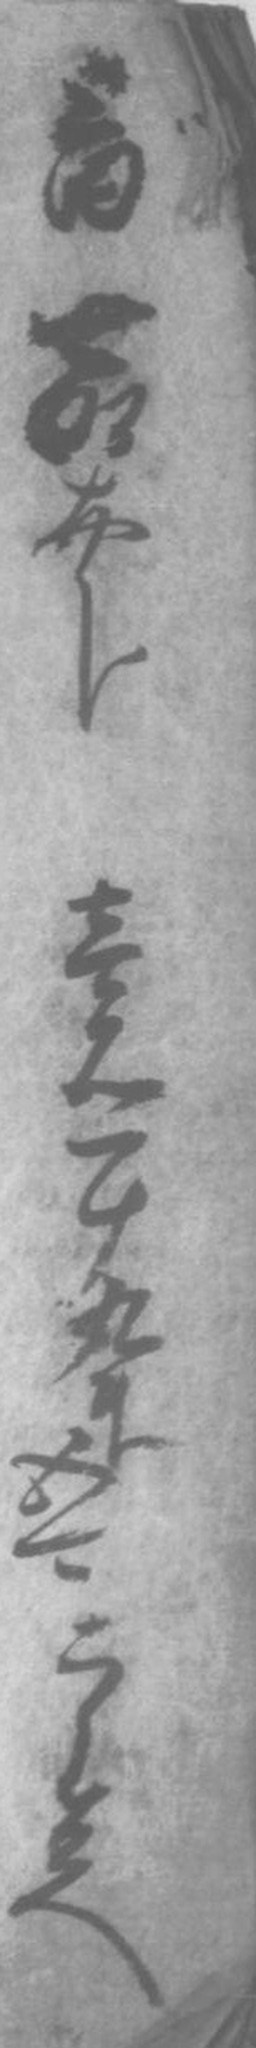上田七畝十四分壱石一斗九升五合二郎兵衛
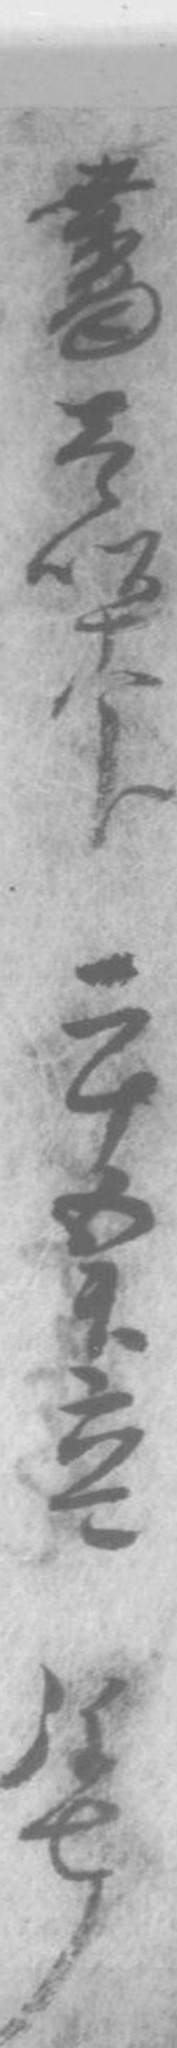桑畠壱畝十八分二斗五升六合弥七郎
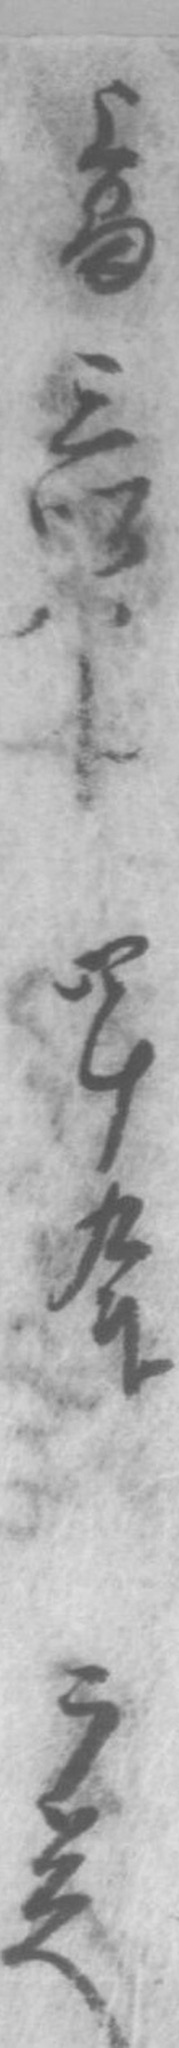上畠三畝八分四斗九升二郎兵衛
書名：越州大野郡ノ内不動堂村御検地帳
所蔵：福井県文書館 Fukui Prefectural Archives
